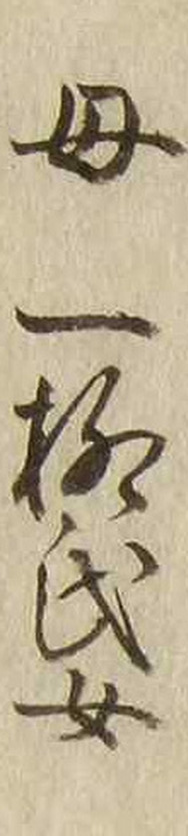母一柳氏女

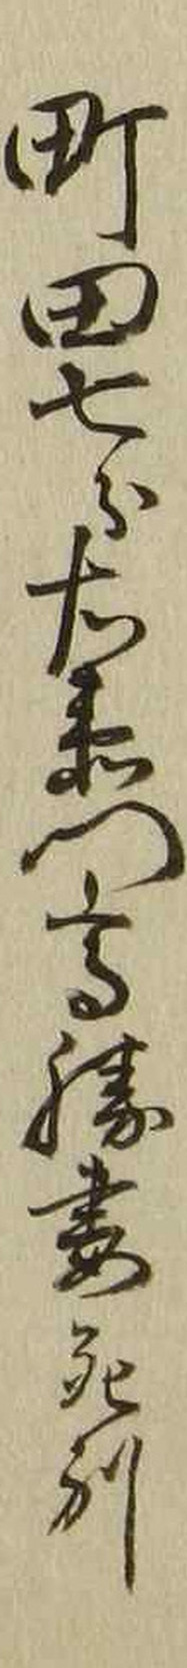町田七郎右衛門高勝妻死別
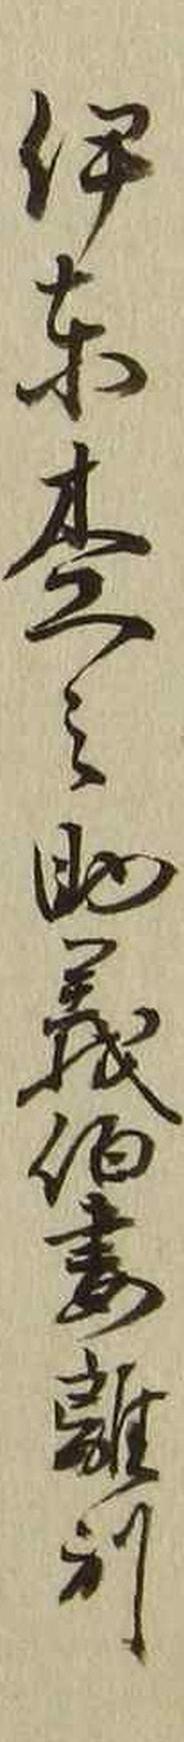伊東杢之助義伯妻離別
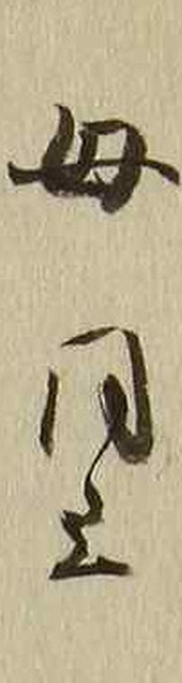母同上
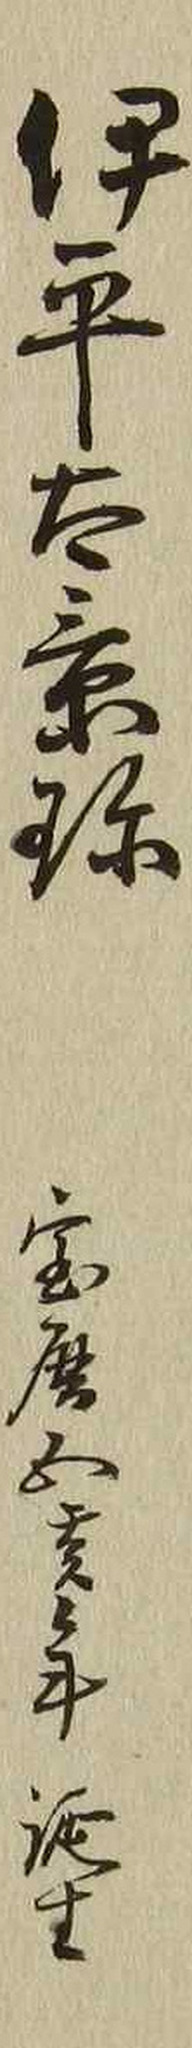伊平太景珍宝暦五亥年誕生
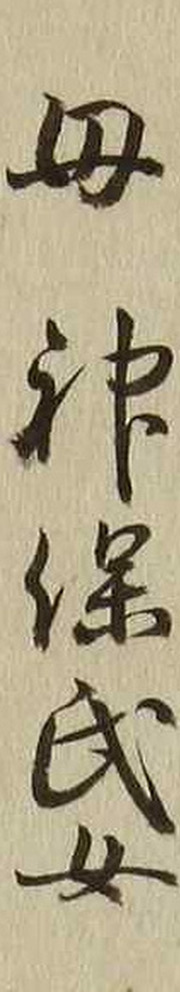母神保氏女
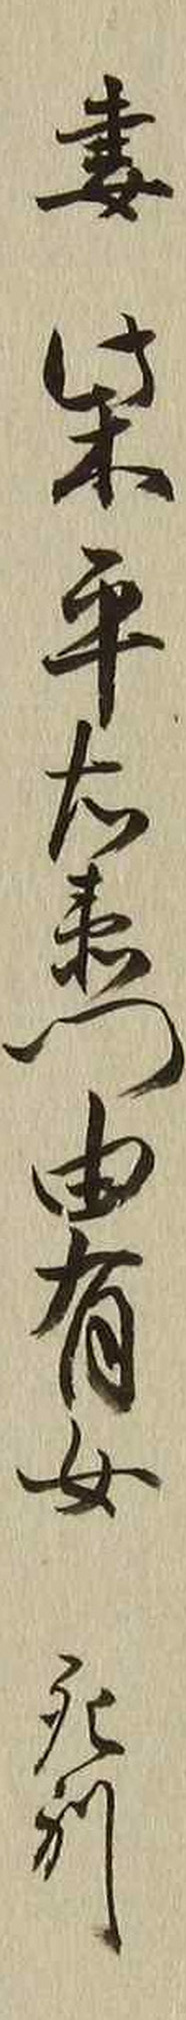妻柴平右衛門由有女死別
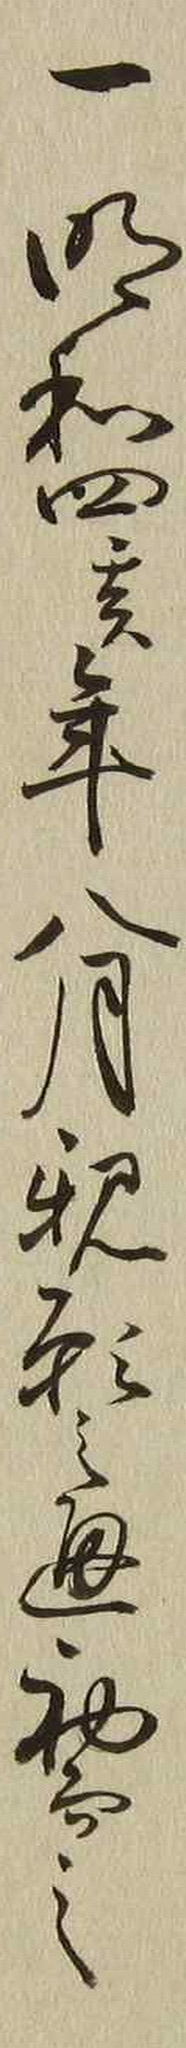一明和四亥年八月親願之通初而之
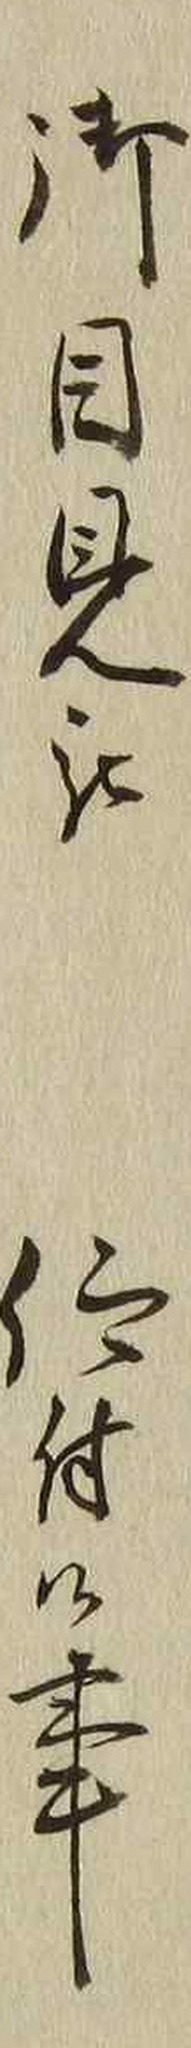御目見被仰付候事
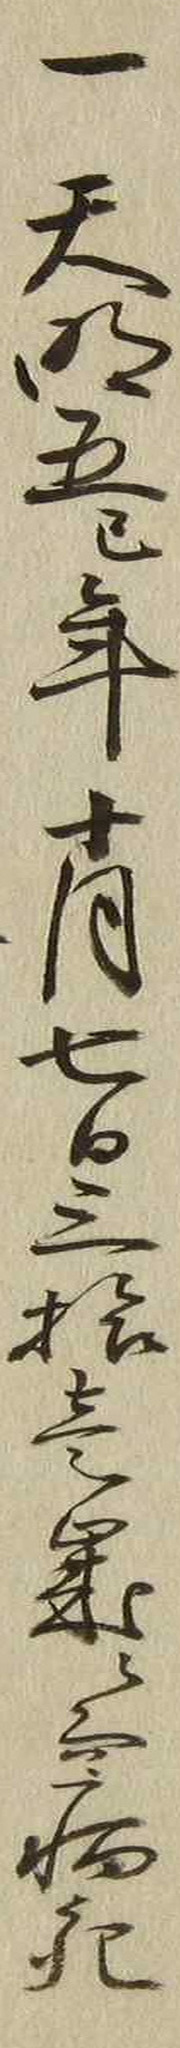一天明五巳年十月七日三拾壱歳ニ而病死
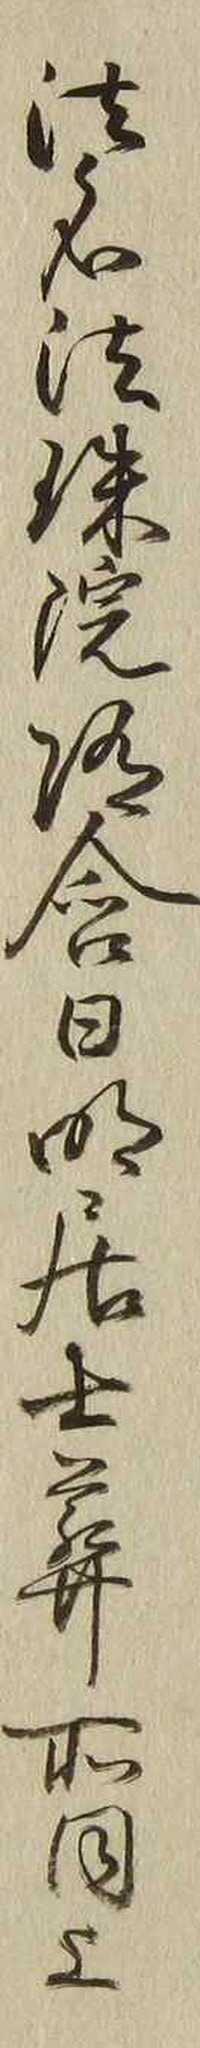法名法珠院随合日明居士葬所同上
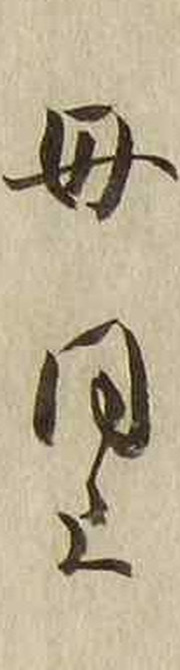母同上

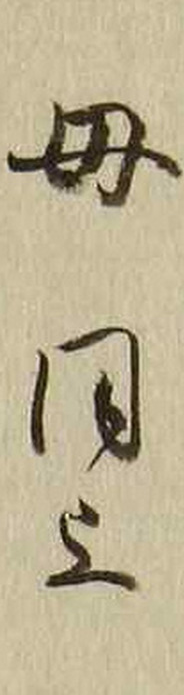母同上
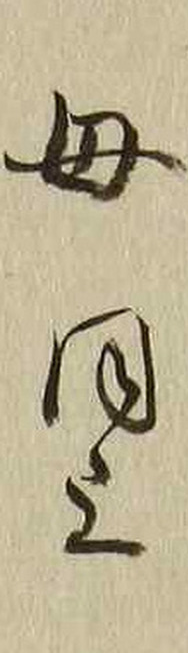母同上
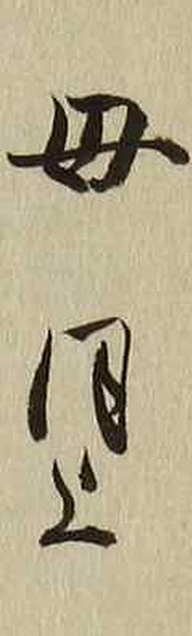母同上
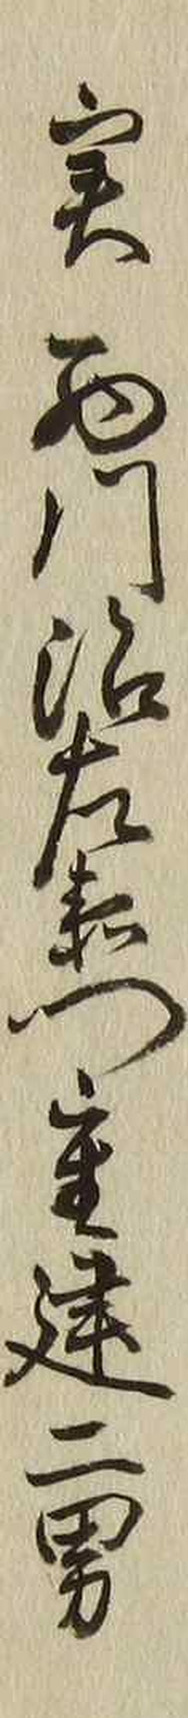実西川治左衛門重建二男
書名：諸士系譜　巻之60　と之部3
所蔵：会津若松市立会津図書館
